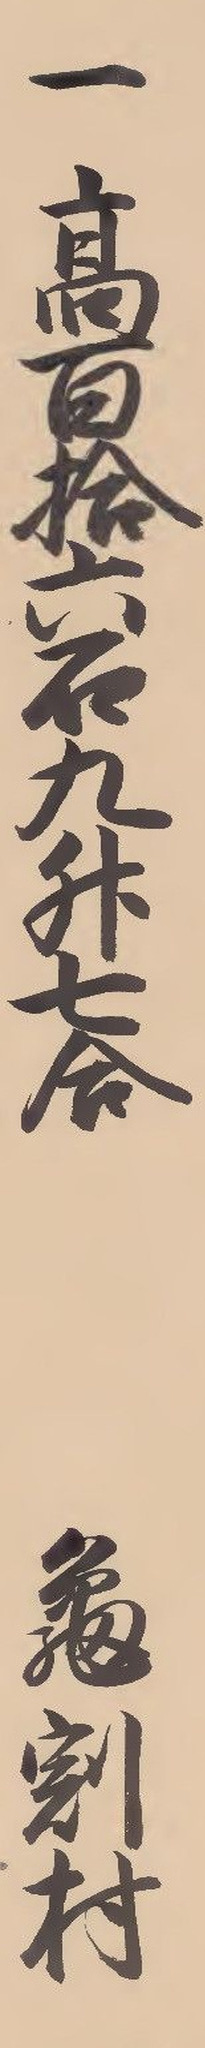一髙百拾六石九升七合龜割村
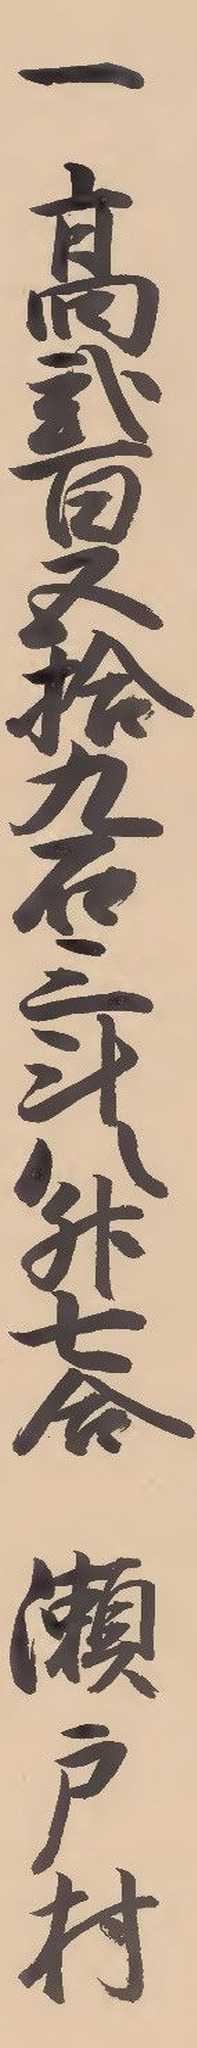一髙弐百五拾九石三斗八升七合瀬戸村
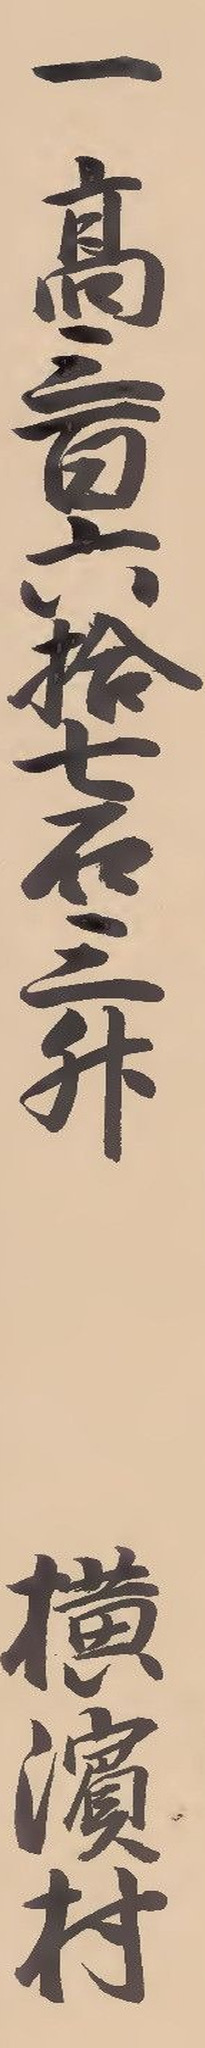一髙三百六拾七石三升横濱村
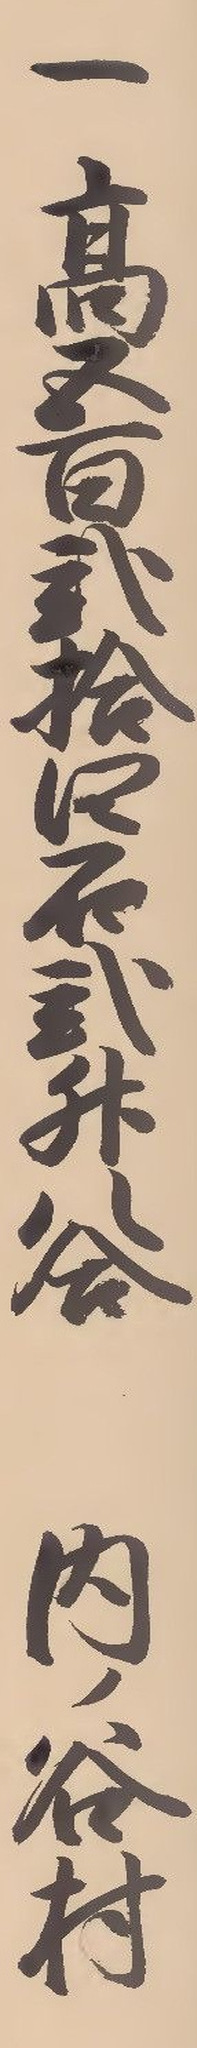一髙五百弐拾四石弐升八合内ノ谷村
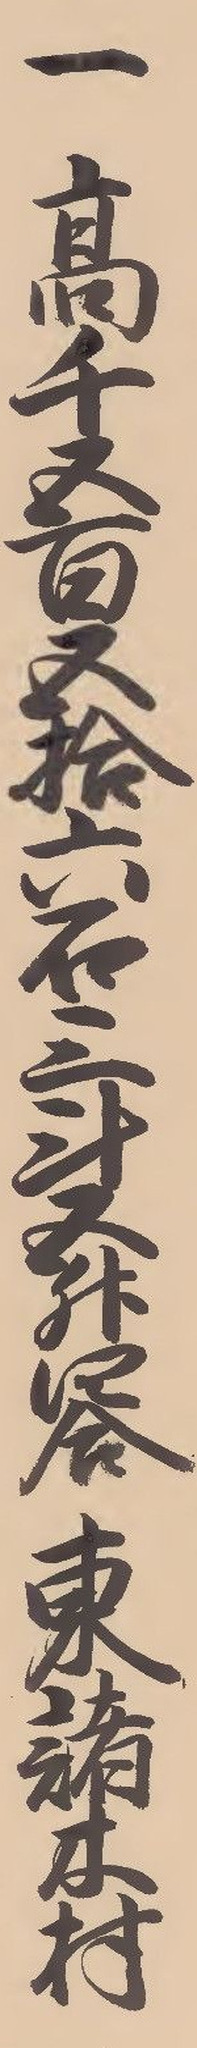一髙千五百五拾六石三斗五升四合東諸木村
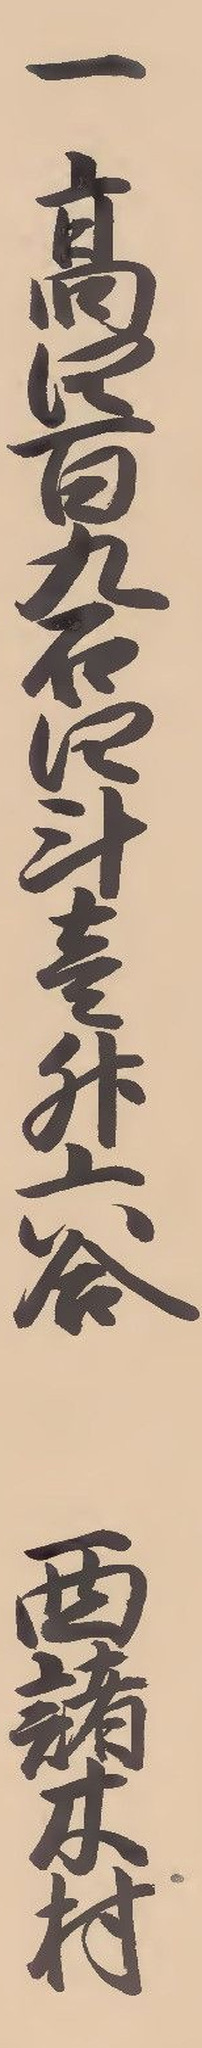一髙四百九石四斗壱升六合西諸木村
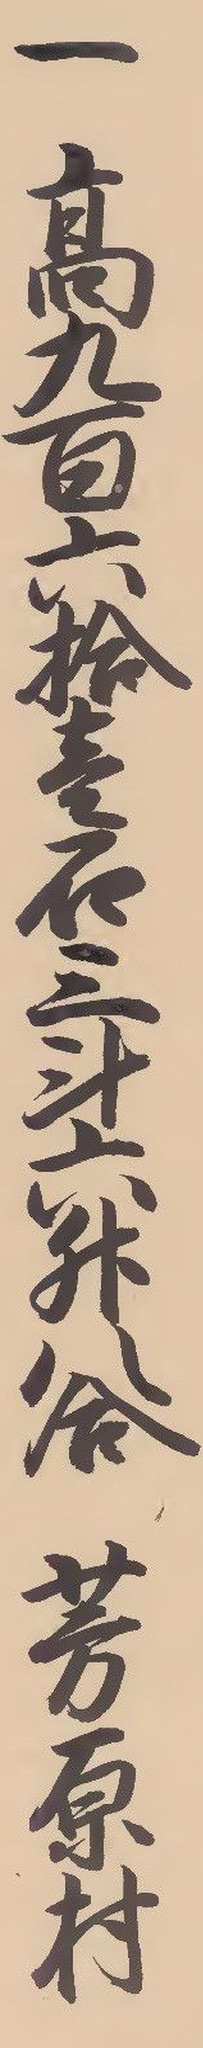一髙九百六拾壱石三斗六升八合芳原村

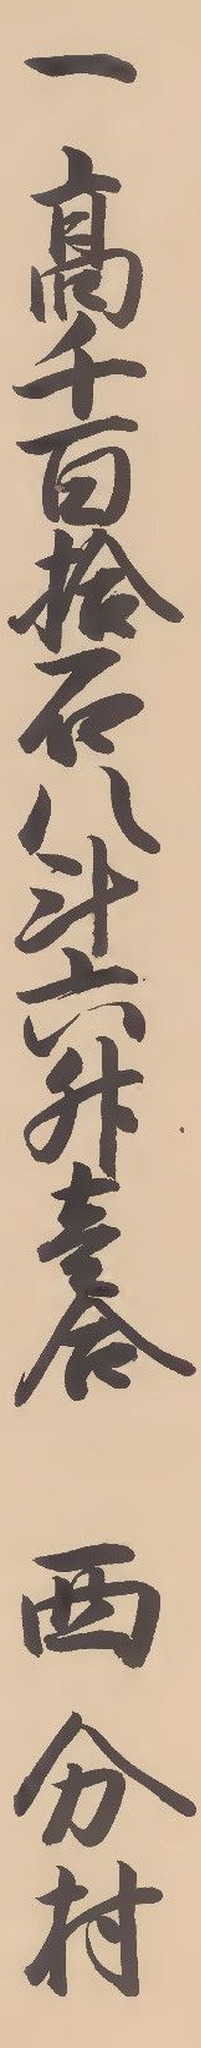一髙千百拾石八斗六升壱合西分村
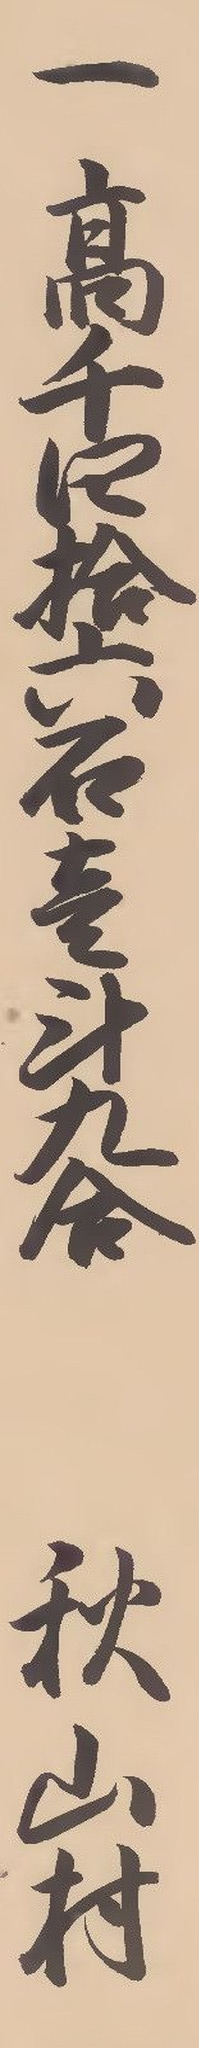一髙千四拾六石壱斗九合秋山村
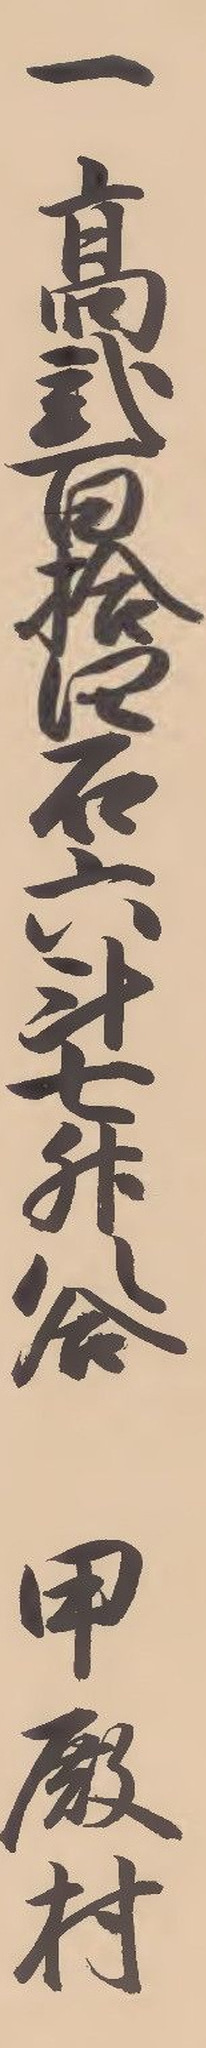一髙弐百拾四石六斗七升八合甲殿村
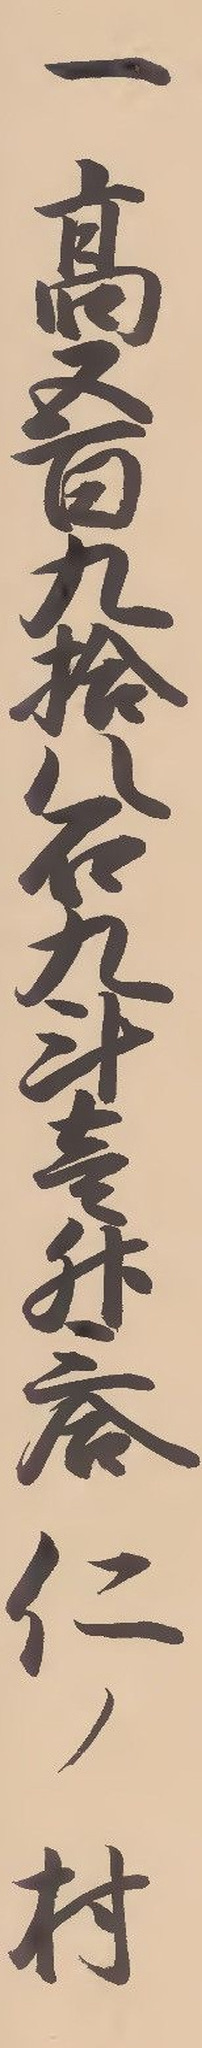一髙五百九拾八石九斗壱升二合仁ノ村
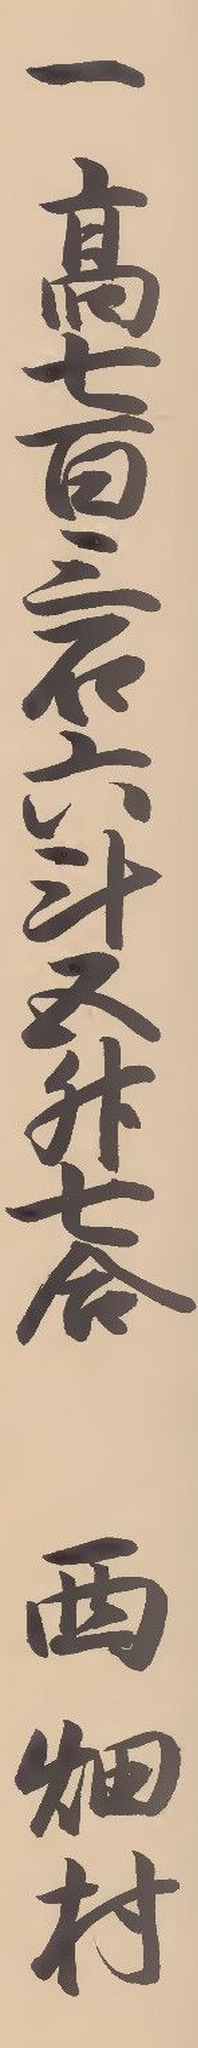一髙七百三石六斗五升七合西畑村
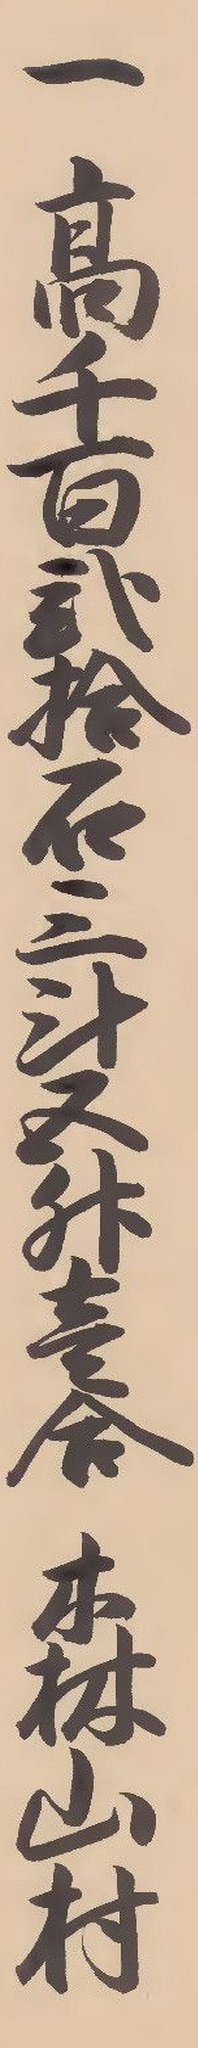一髙千百弐拾石三斗五升壱合森山村
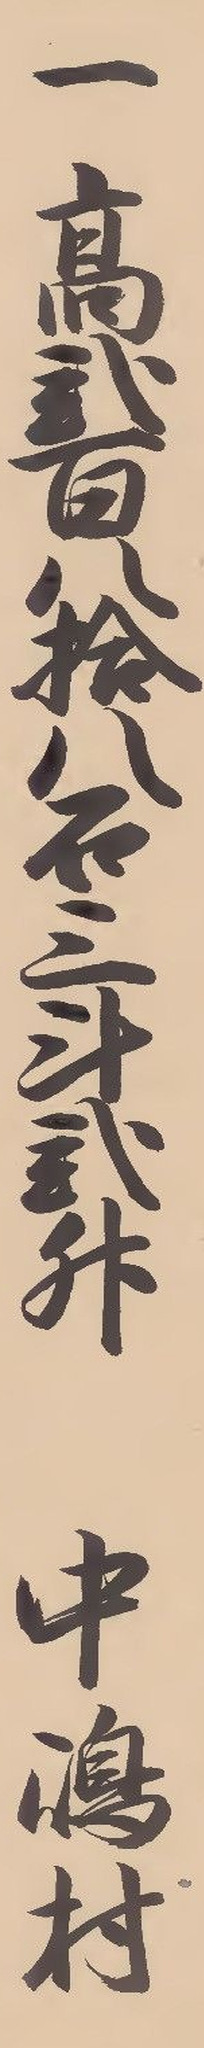一髙弐百八拾八石三斗弐升中嶋村
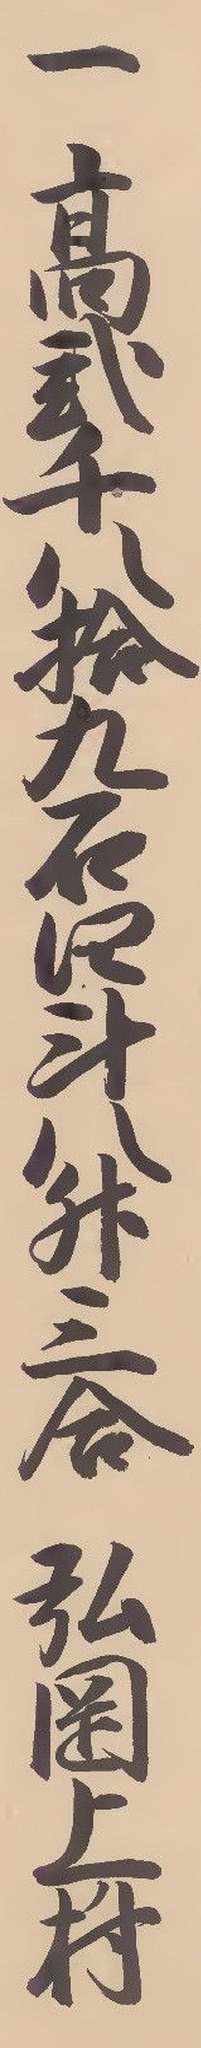一髙弐千八拾九石四斗八升三合弘岡上ノ村

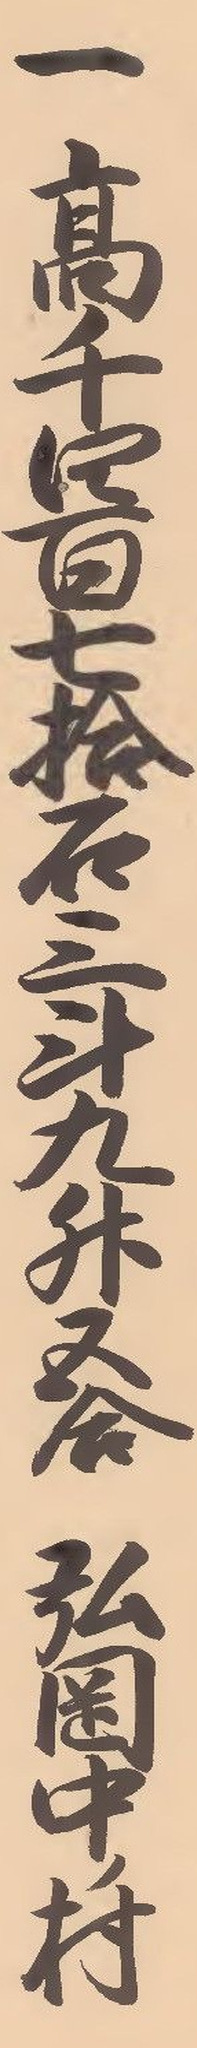一髙千四百七拾石三斗九升五合弘岡中ノ村
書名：土佐国郷帳
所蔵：国立公文書館 National Archives of Japan
